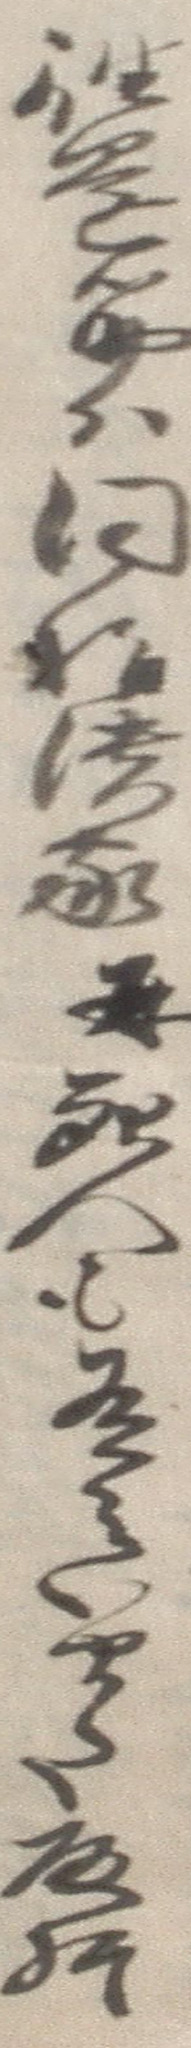往還筋ハ同様潰家并死人も有之いまた通行
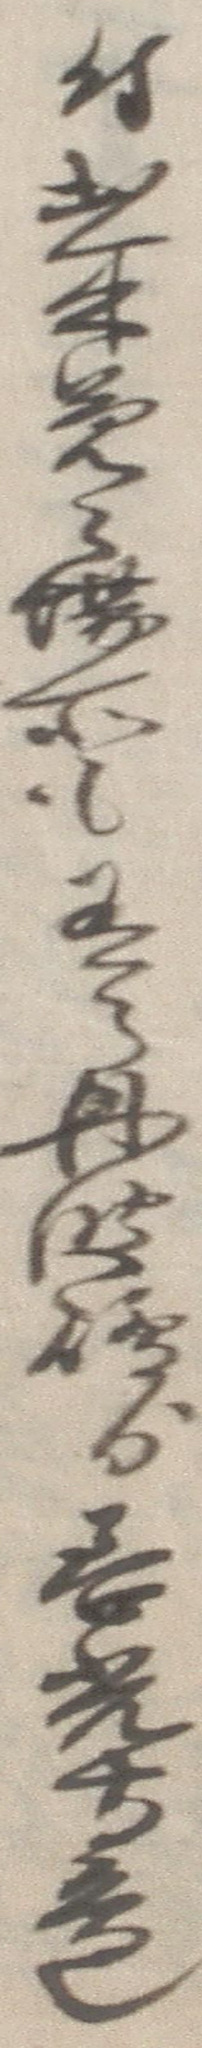付出来兼候場所も有之丹波嶋ゟ善光寺辺
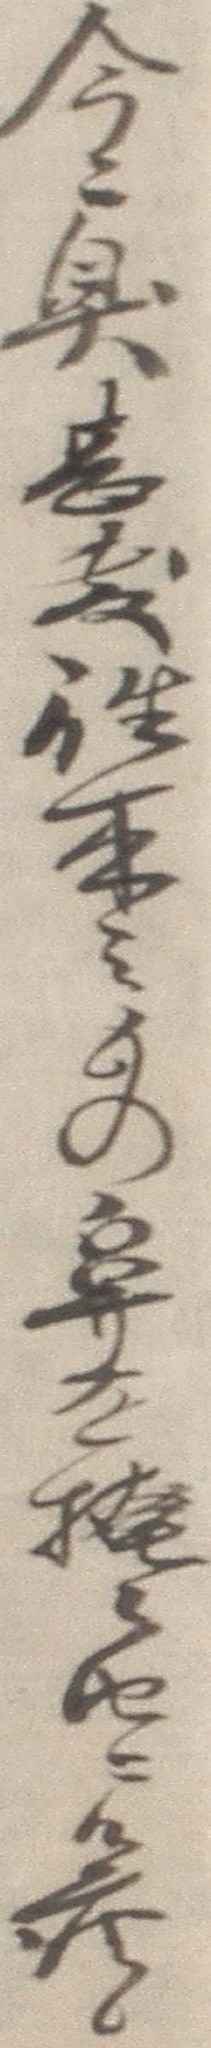今二臭甚敷往来之もの鼻を掩候由二御座候
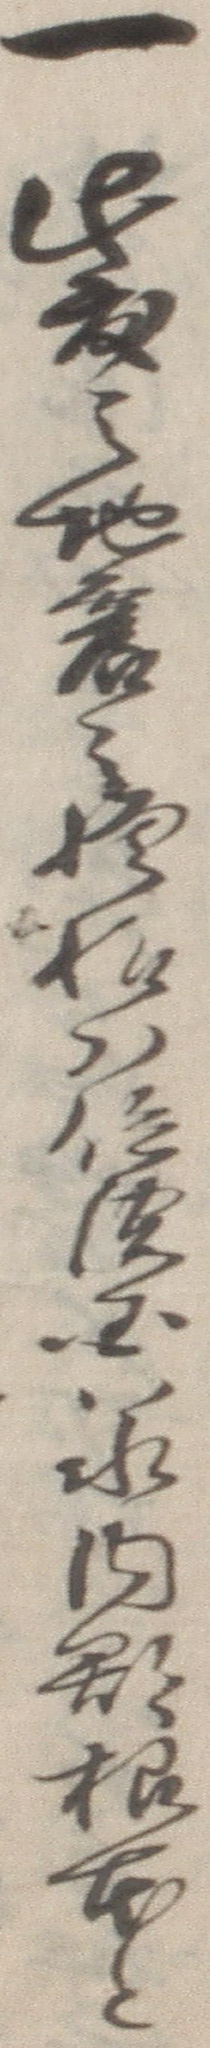一此度之地震之摸様ハ信濃国ハ水内郡根本と
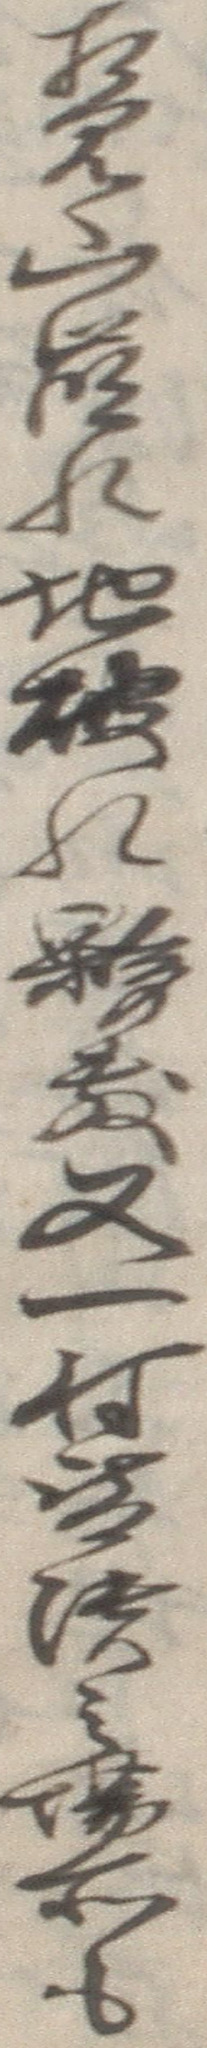相見山崩地破れ夥敷又一村皆潰之場所も
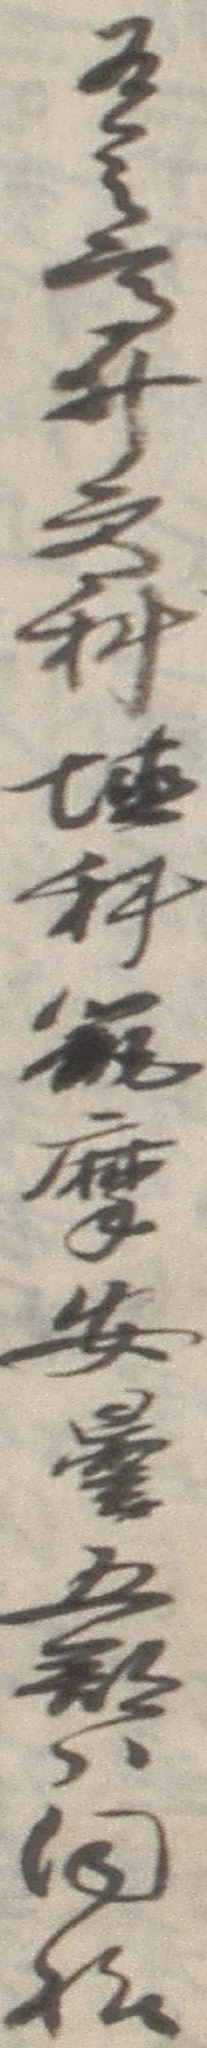有之高井更級埴科筑摩安曇五郡ハ同様
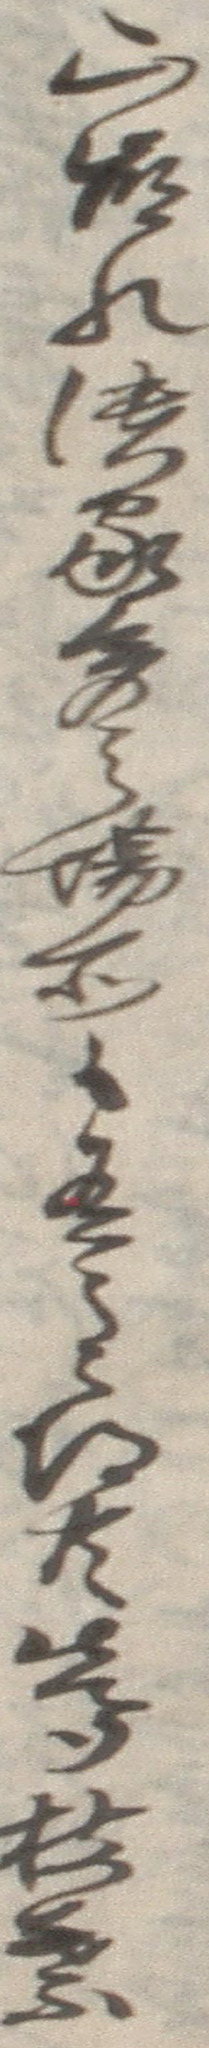山崩潰家多之場所も有之候得共先ツ枝葉
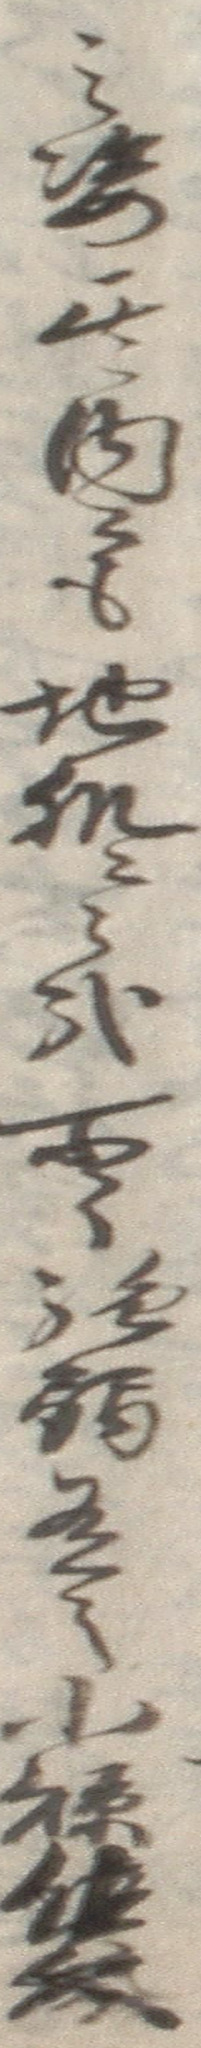之姿其内にも地肌二候哉所々強弱有之小県佐久
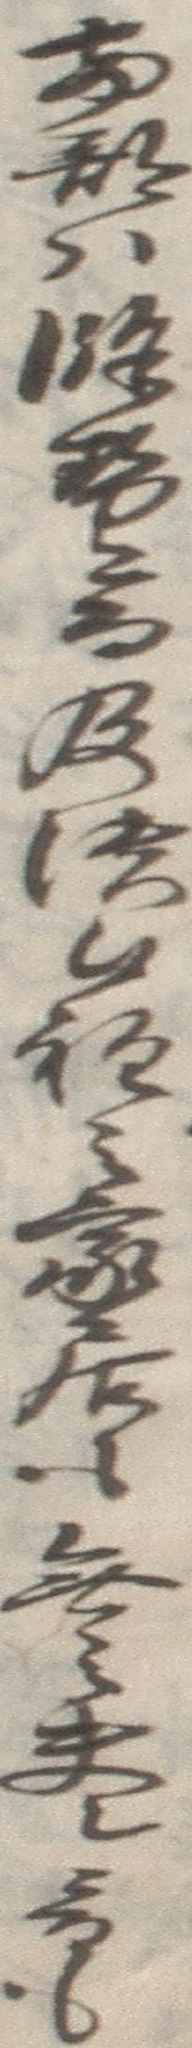両郡ハ餘勢二而及潰候程之家居も無之夫レ二而も
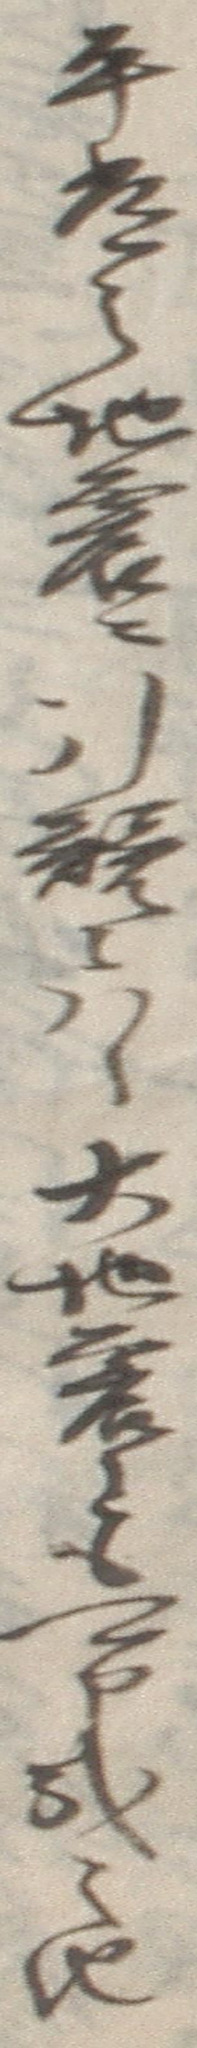平常之地震二引続候ハゝ大地震二も可申哉之由
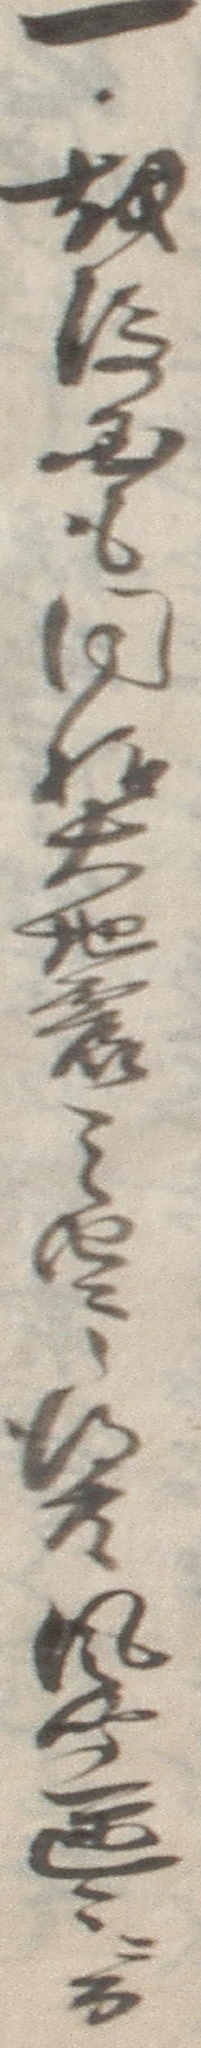一越後国も同様大地震之由二候得共風聞区々二而
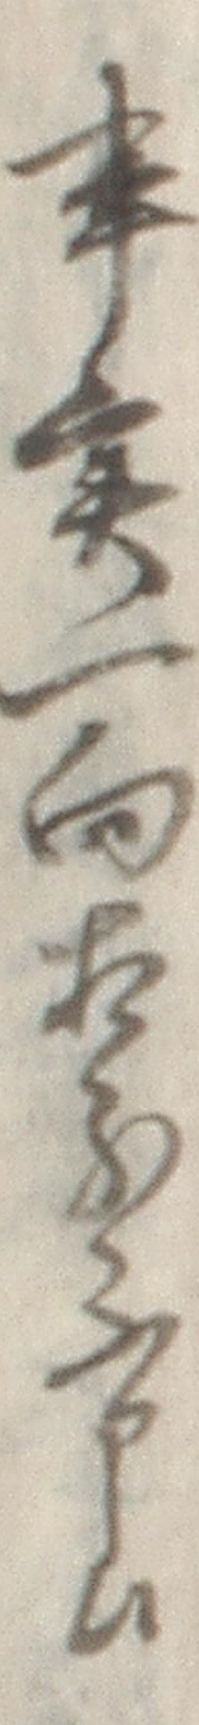事実一向相分不申候
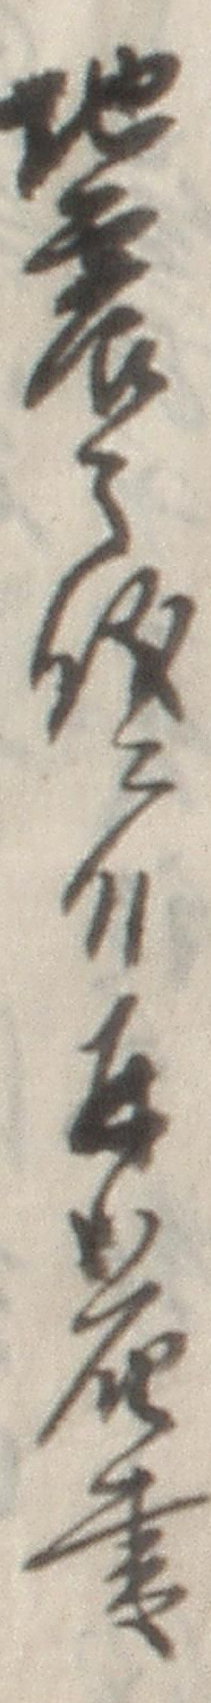地震之儀二付再御届書
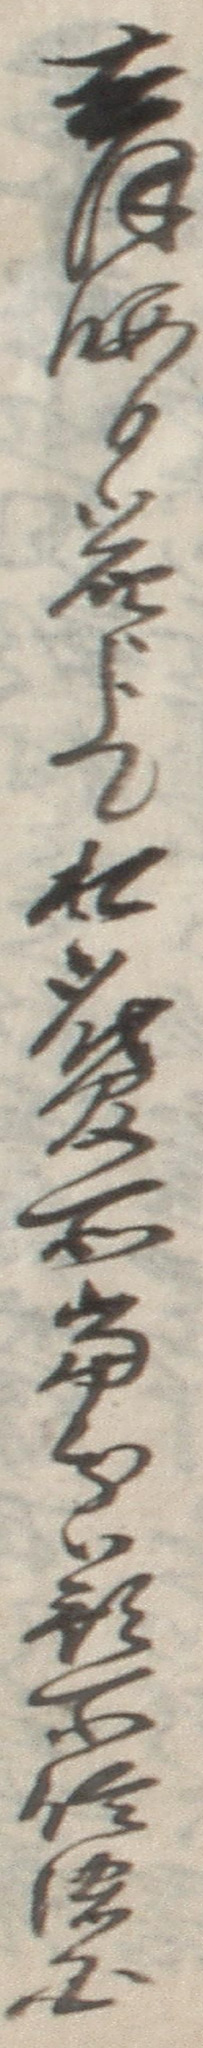去月晦日御届申上候私御代官所当分御預所信濃国

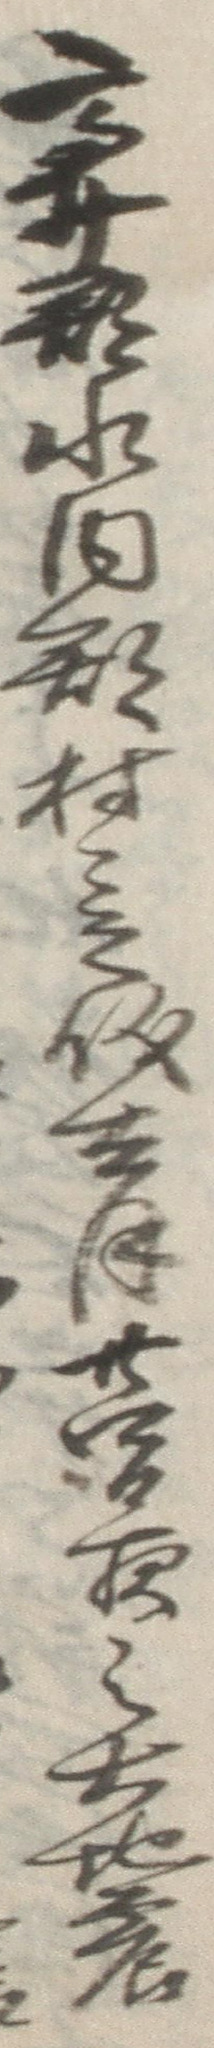高井郡水内郡村々之儀去月廿四日夜之大地震
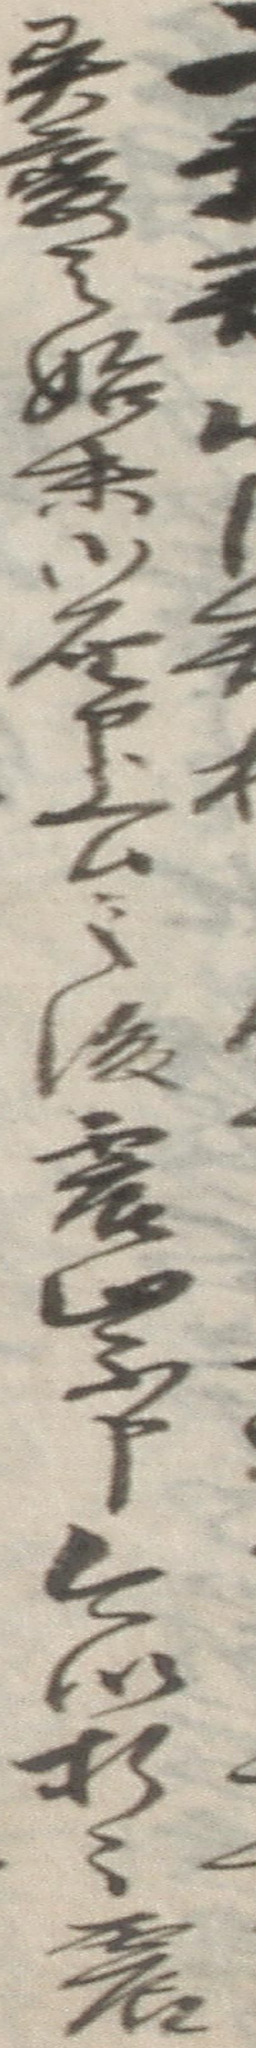異変之始末御届申上候之後震止不申今以折々震
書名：信州地震一件
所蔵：東京大学地震研究所図書室 Earthquake Research Institute Library, The University of Tokyo, JAPAN
